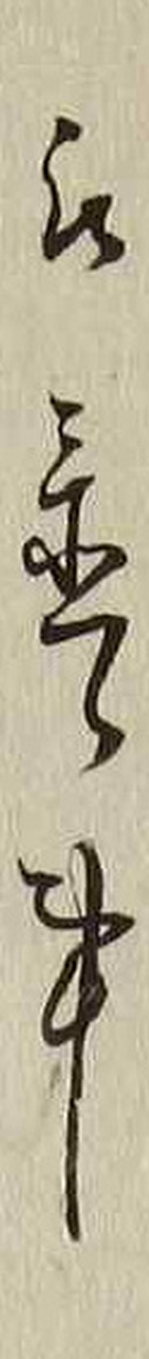被置候事
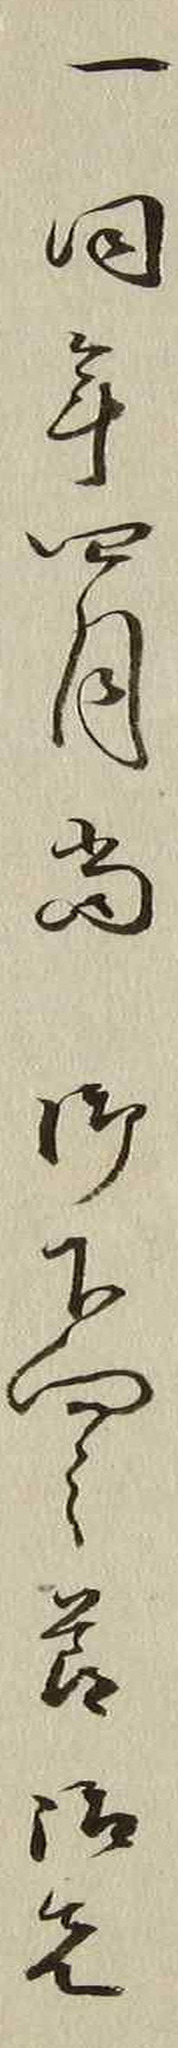一同年四月当御下向之節御先
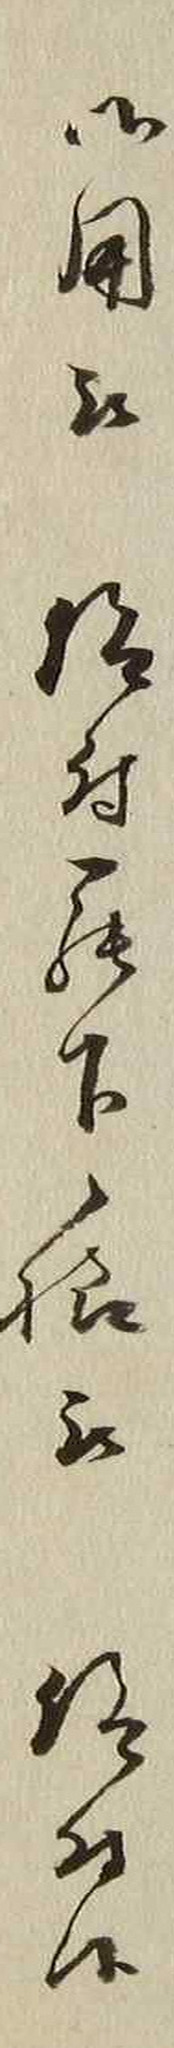御用被仰付罷下候様被仰付候
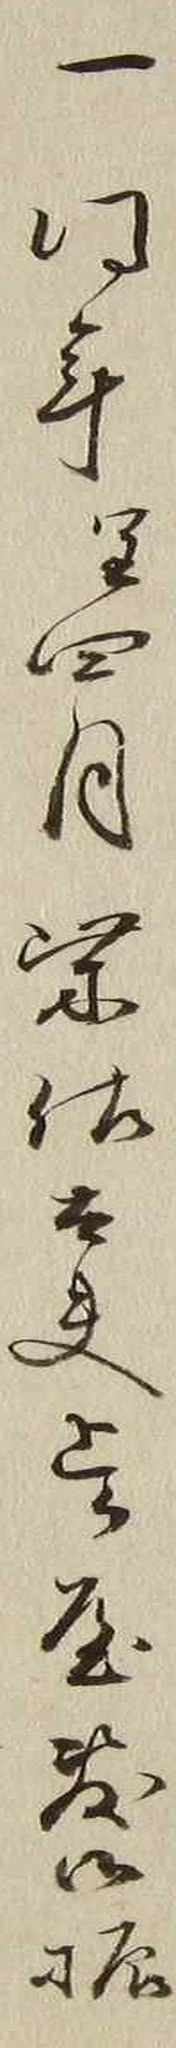一同年閏四月柴佐太夫上ケ屋敷御振
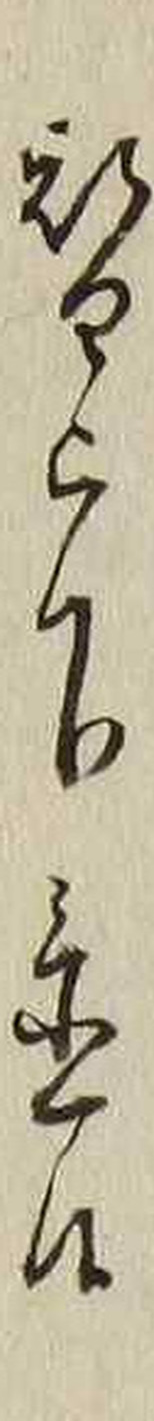替被下置候
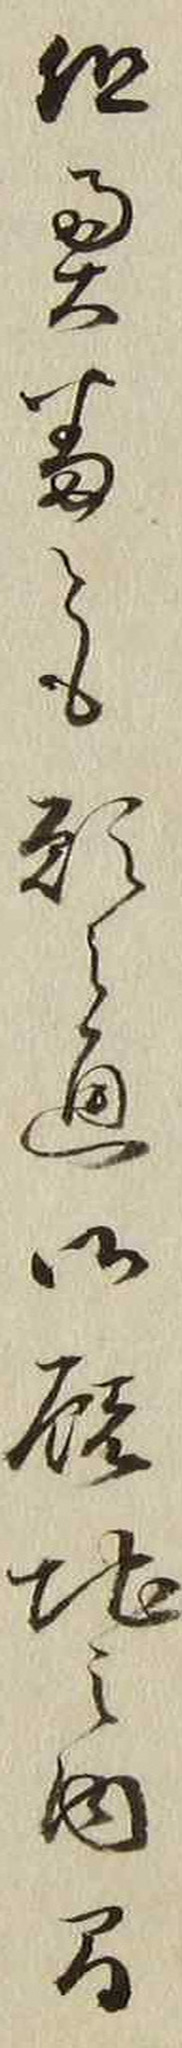但奥番とも願之通御厩地之内間
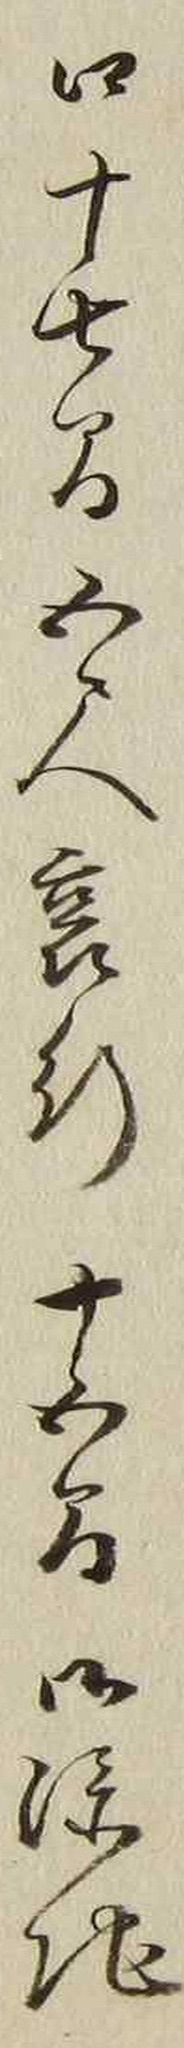口十七間五尺裏行十五間御添地
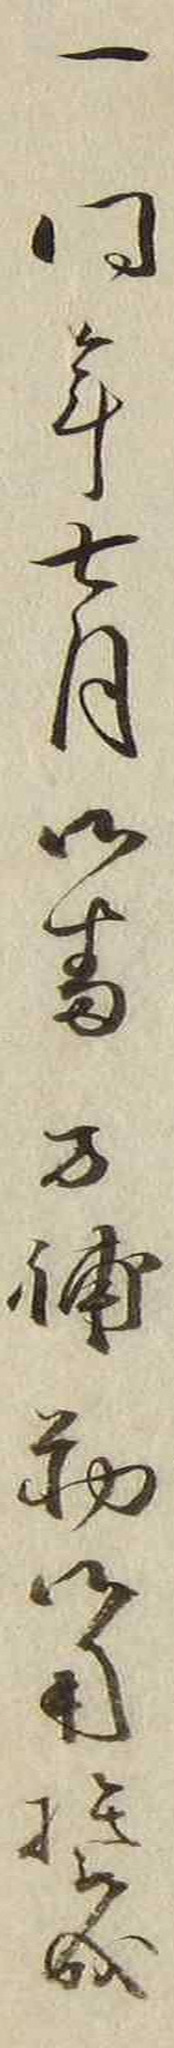一同年七月御番方補勤御用捨被成

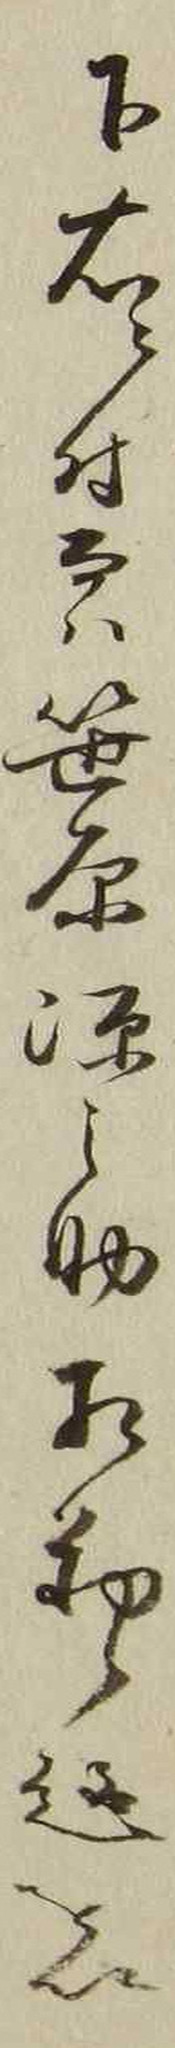下右ニ付而ハ笹原源之助相勤候趣を以
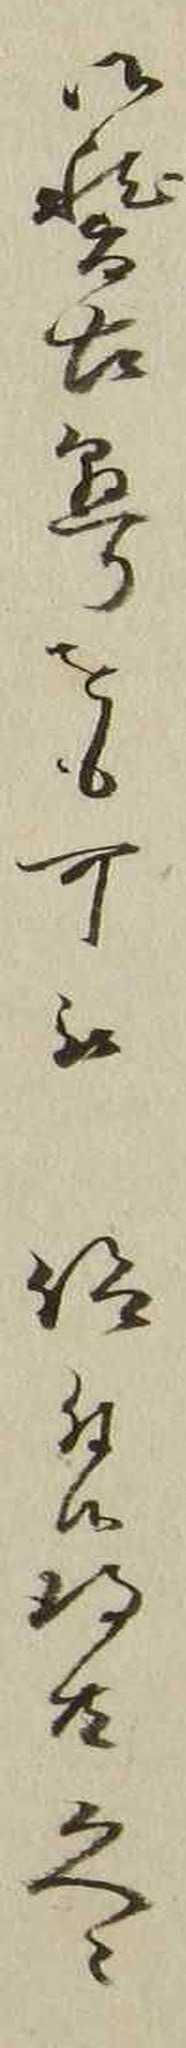御稽古懸りをも可被仰付候得共久々
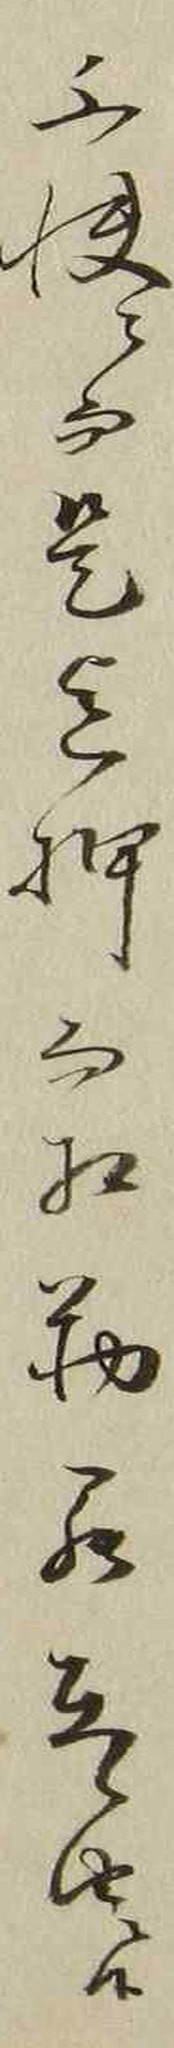不快ニ而是迄押而相勤罷在候由ニ候
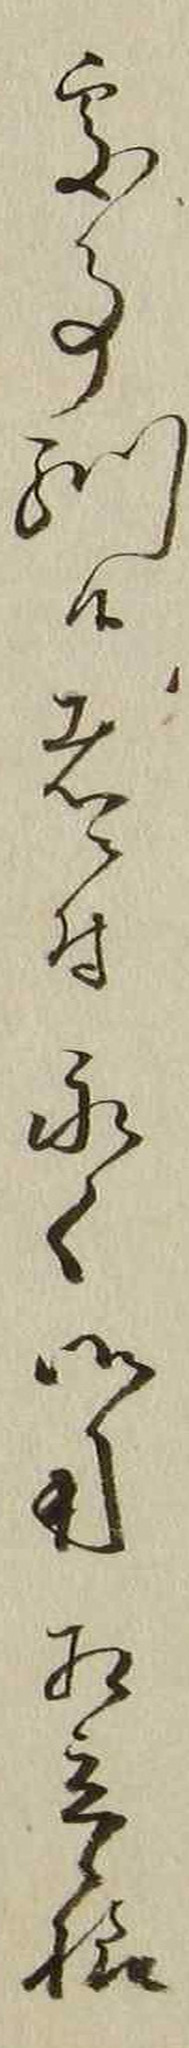処事馴候者ニ付永く御用相立候様
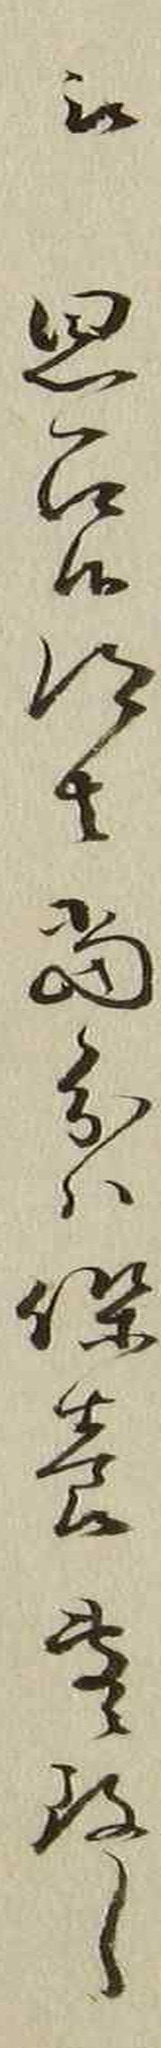被思召候得者当分ハ保養専ニ致し
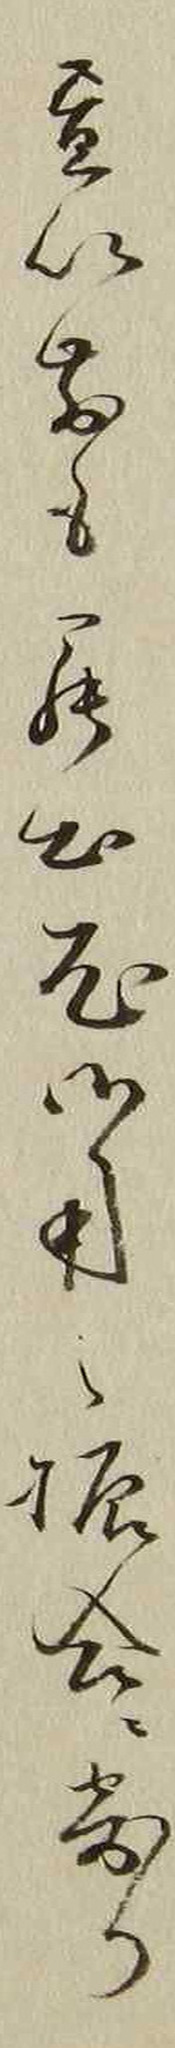昼以前も罷出尤御用之振合ニ寄り
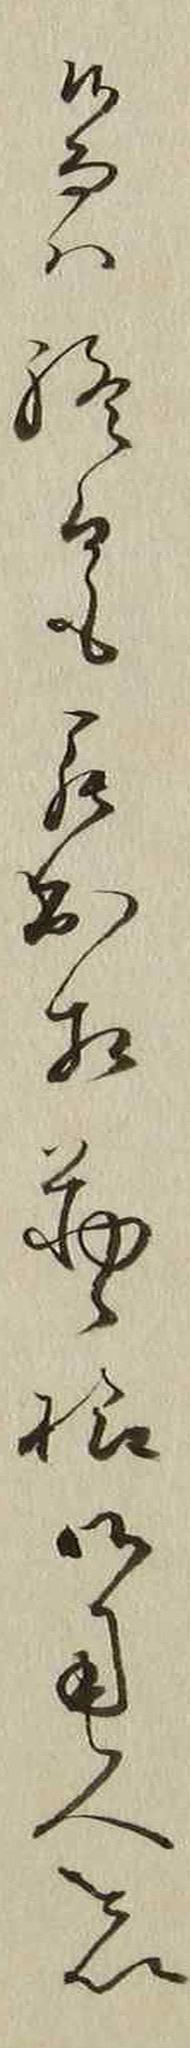候而ハ終日も罷出相勤候様御用人を以
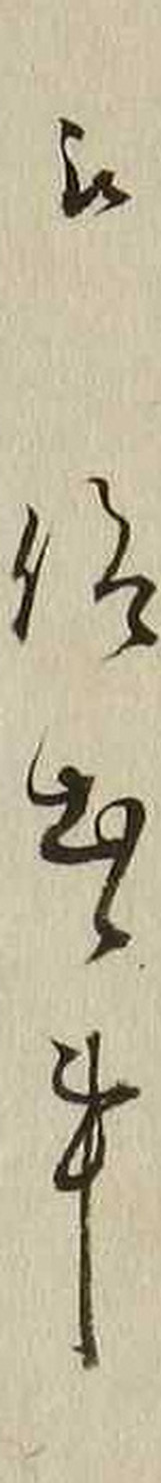被仰出候事
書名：諸士系譜　巻之25　い之部25
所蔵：会津若松市立会津図書館
